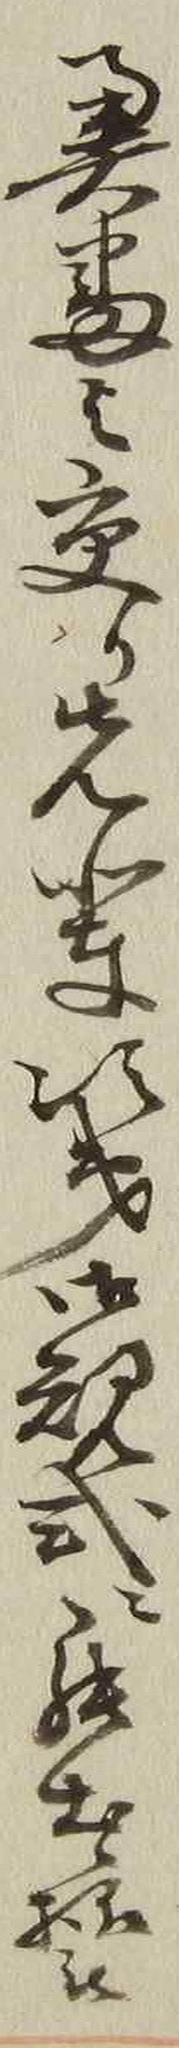奥番与交り先輩次第御規式ニ罷出候様被
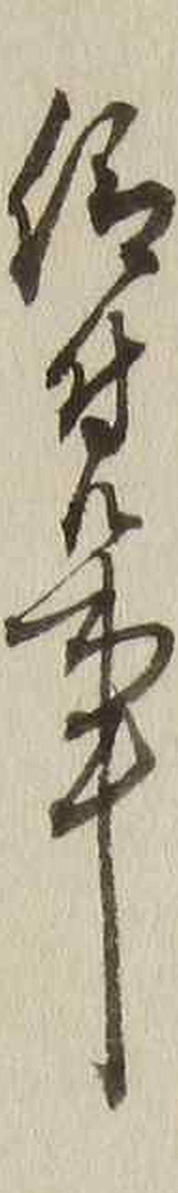仰付候事
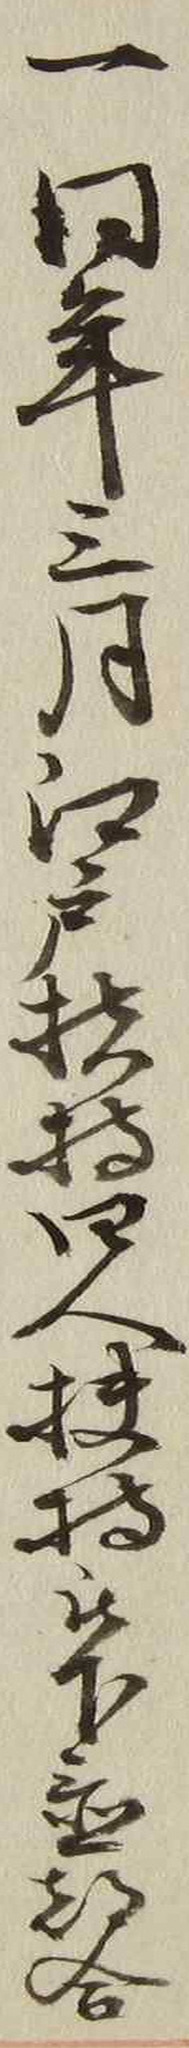一同年三月江戸扶持四人扶持被下置都合
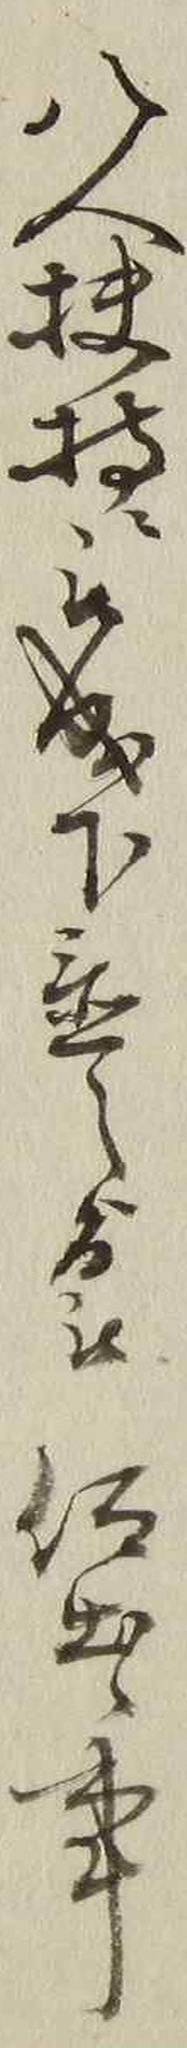八人扶持ニ被成下之旨被仰出候事
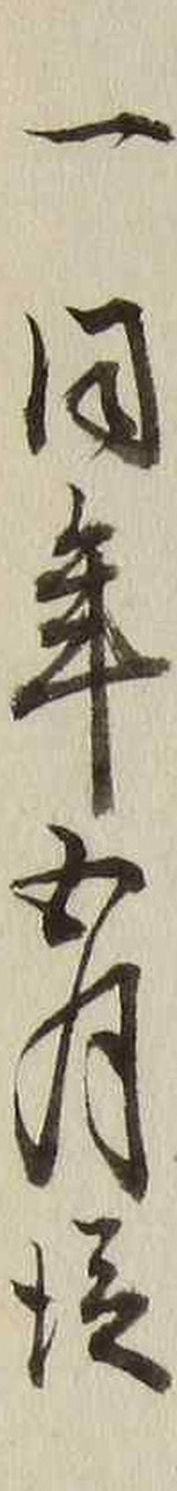一同年五月従
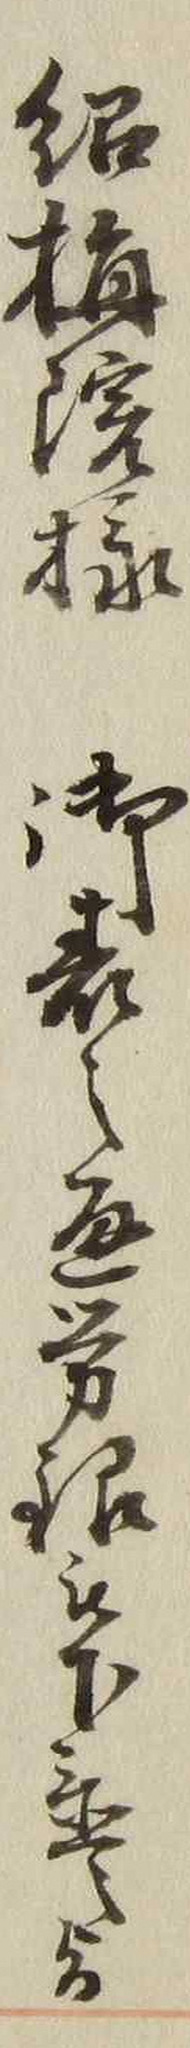紹栴院様御表之通労銀被下置之旨
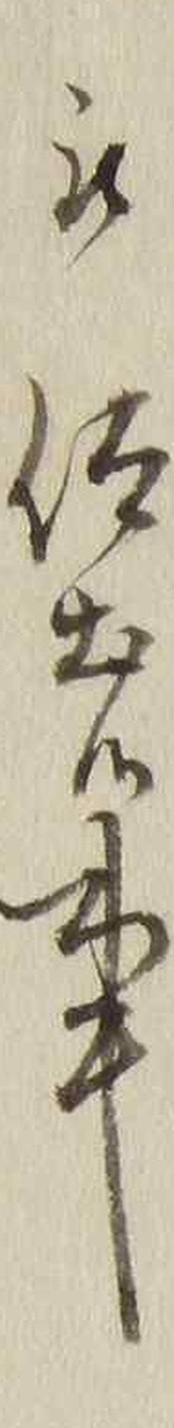被仰出候事
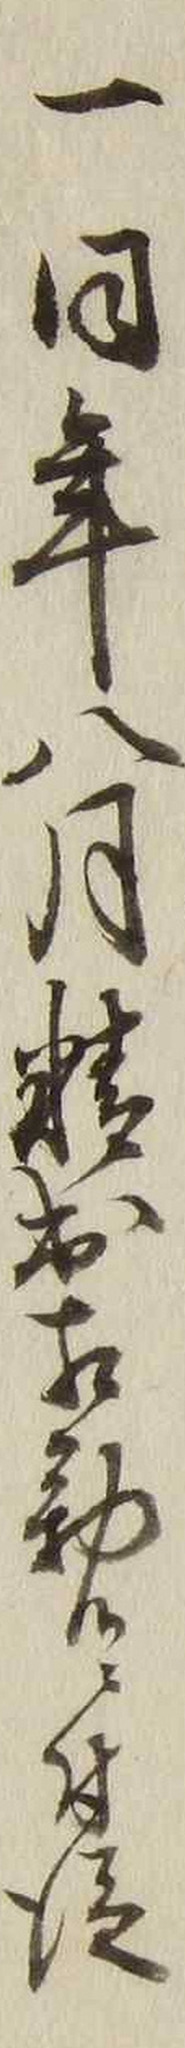一同年八月精出相勤候ニ付従
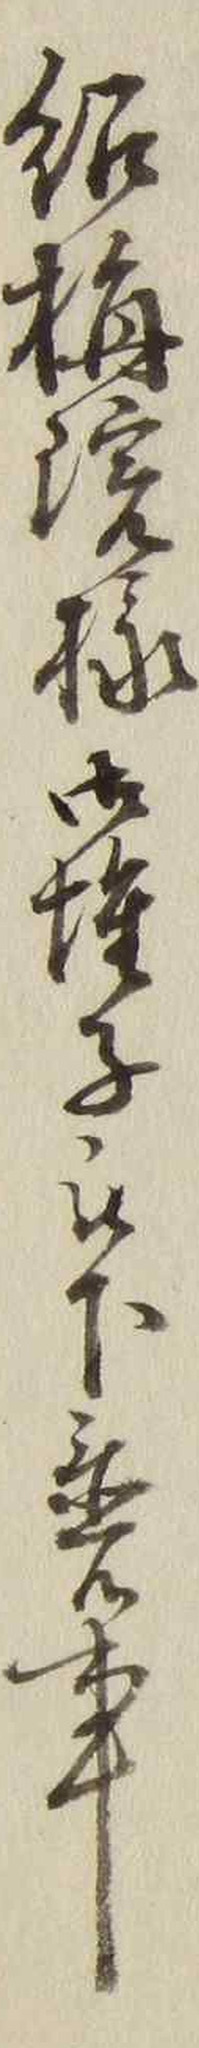紹栴院様御帷子被下置候事

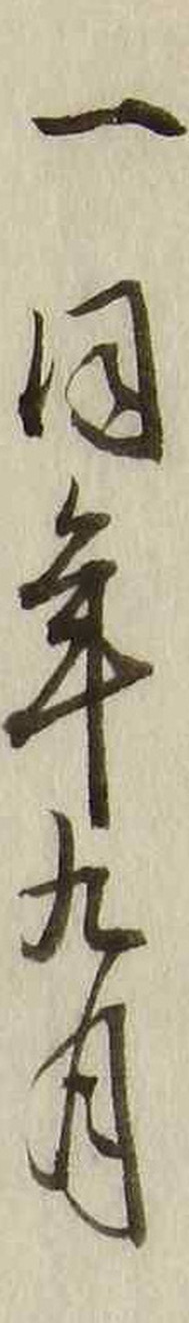一同年九月
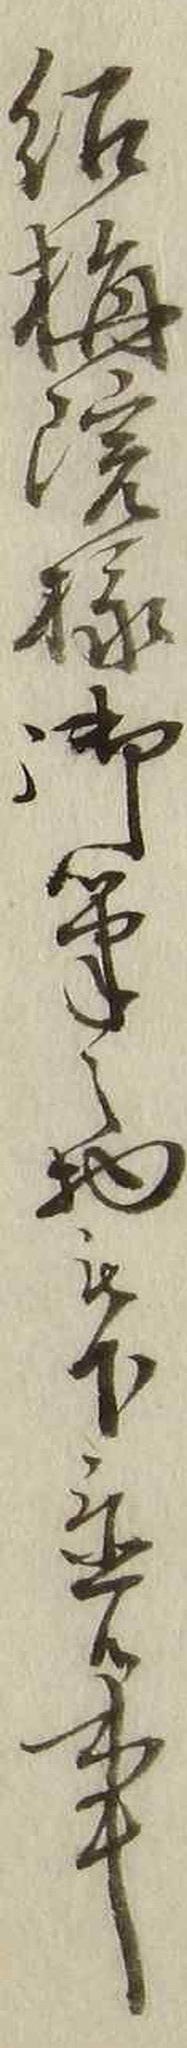紹栴院様御筆之物被下置候事
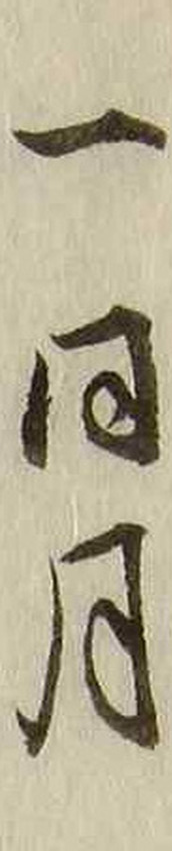一同月
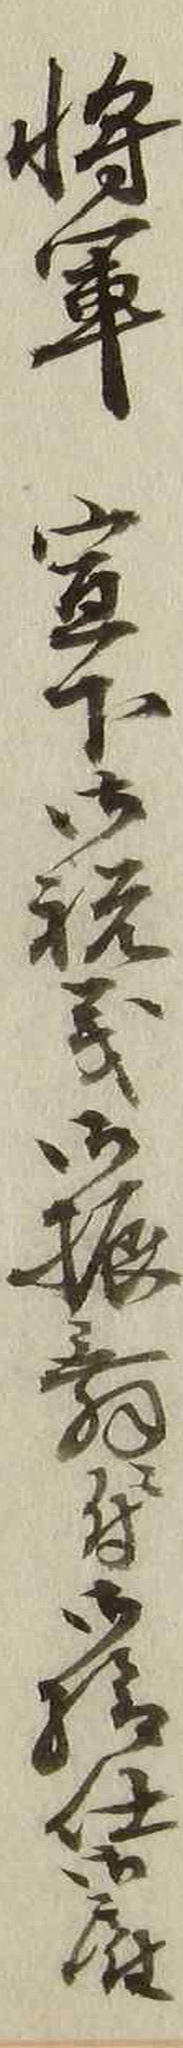将軍宣下御祝義御振舞ニ付御給仕御雇
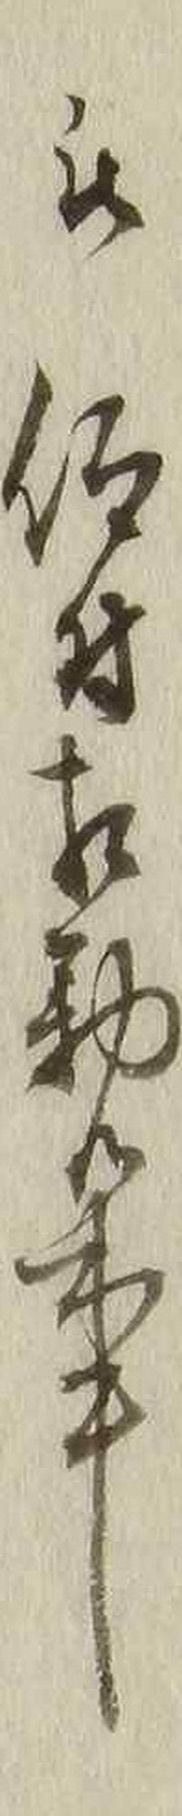被仰付相勤候事
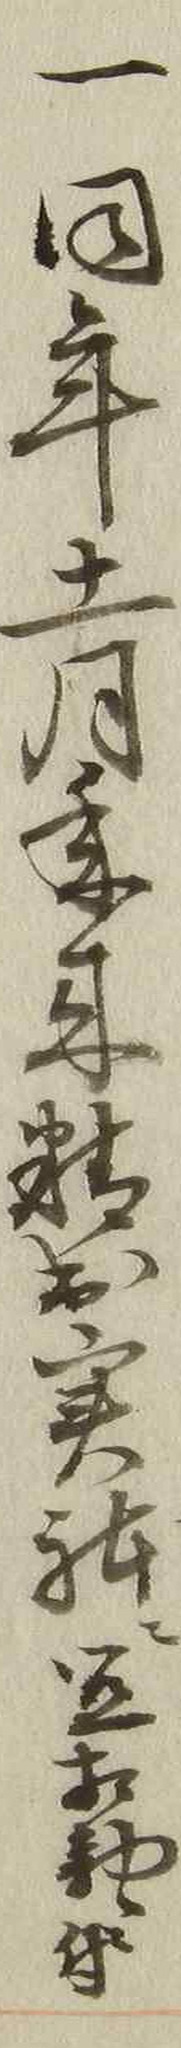一同年十一月年来精出実体ニ宜相勤候ニ付
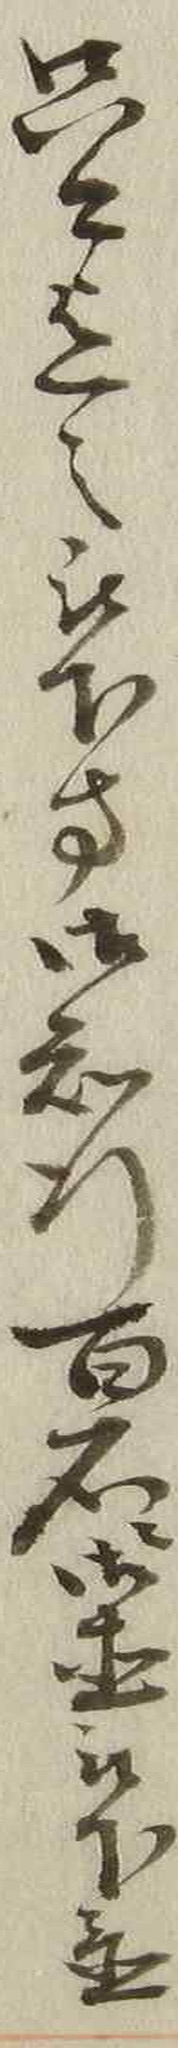只今迄之被下方御知行百石ニ御直被下置
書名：諸士系譜　巻之23　い之部23
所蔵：会津若松市立会津図書館
